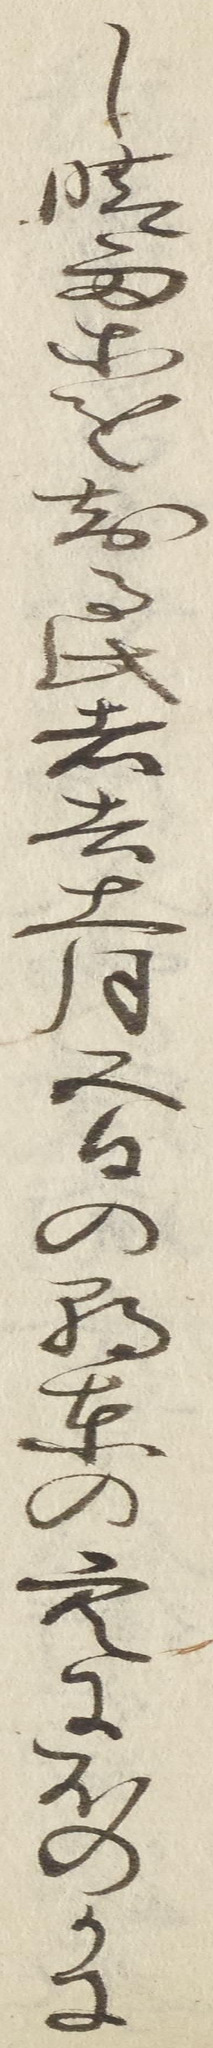し晴雨等を知る此者去十一月五日の朝東の空にほのかに
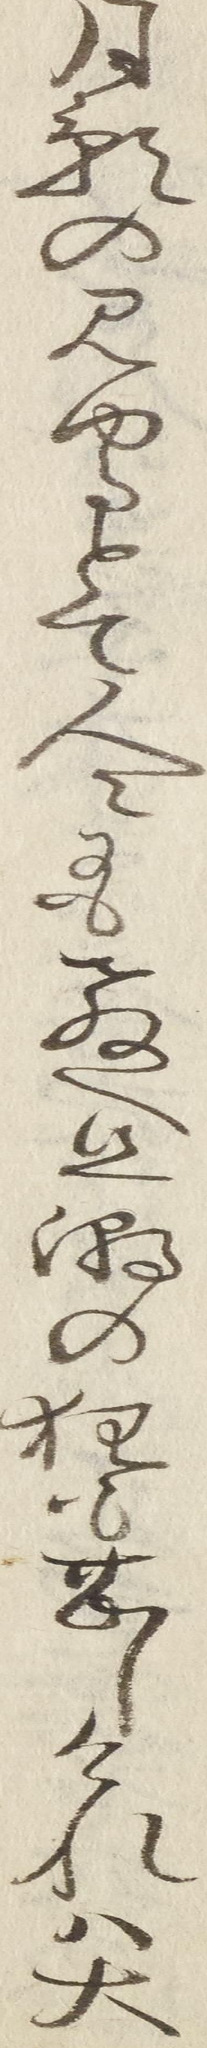月影の見ゆるとて人々にも教え且つ潮の狂も甚しけれは大
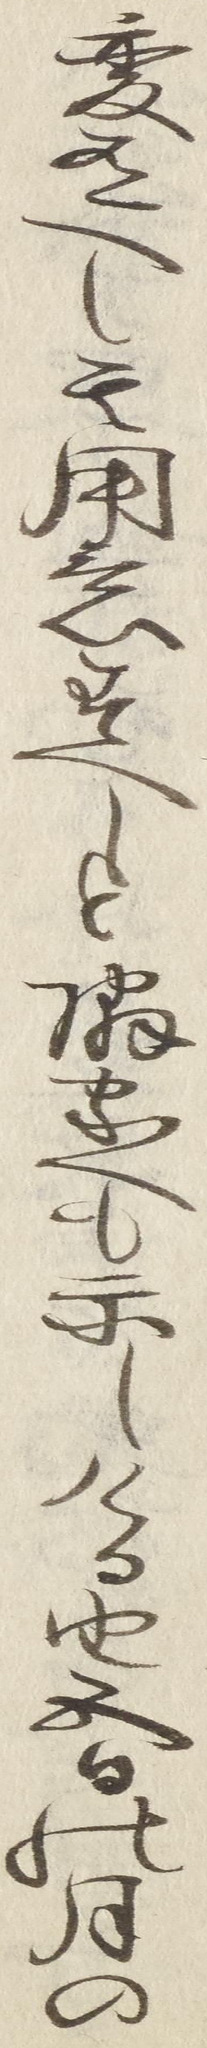変有へし其用意すへしと隣家へも示しける由五日の月の
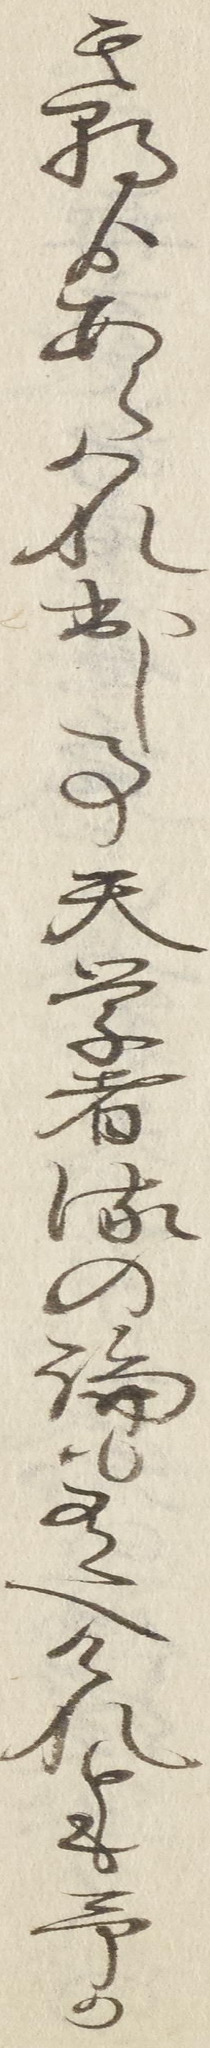其朝よりあらわれ出し事天学者流の論も有へけれとも予の
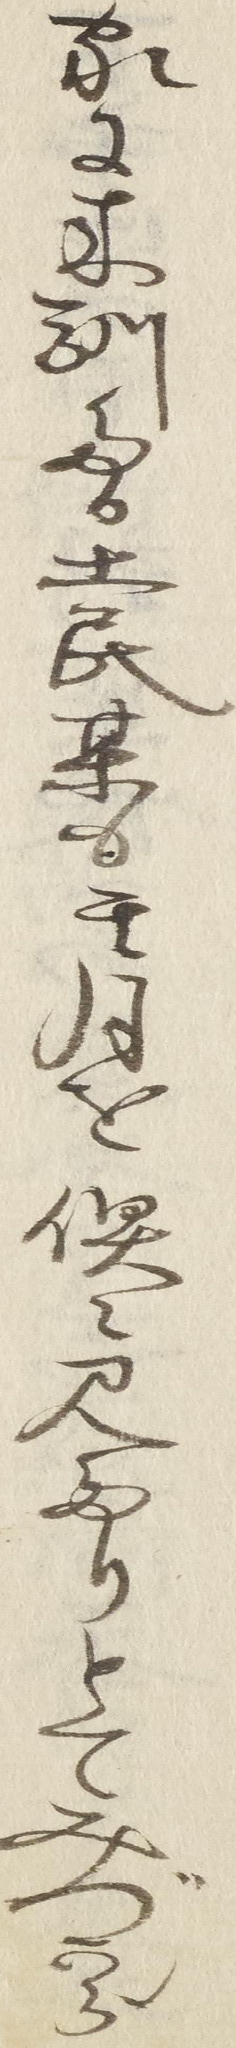家に来馴たる土民某も其月を俱に見たりとてみずから
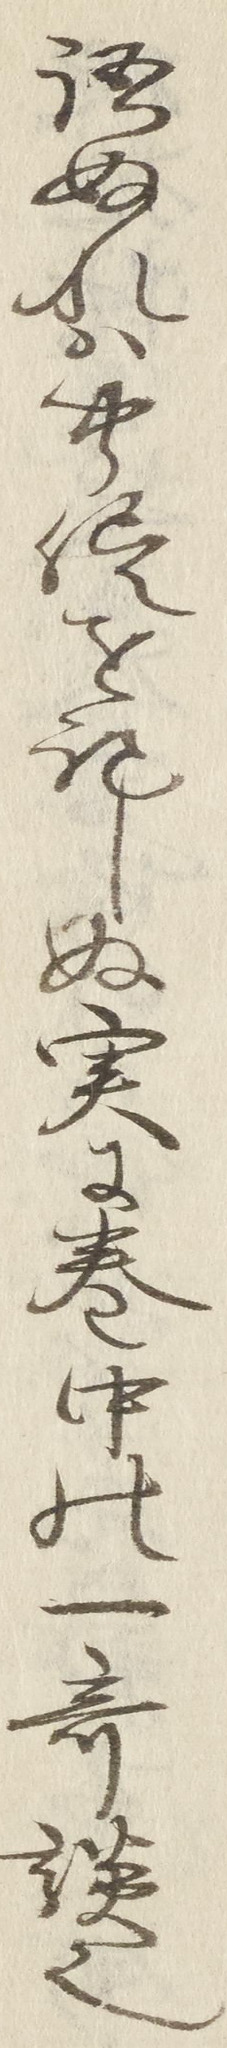語ぬれは聞侭を記しぬ実に巻中の一奇談也
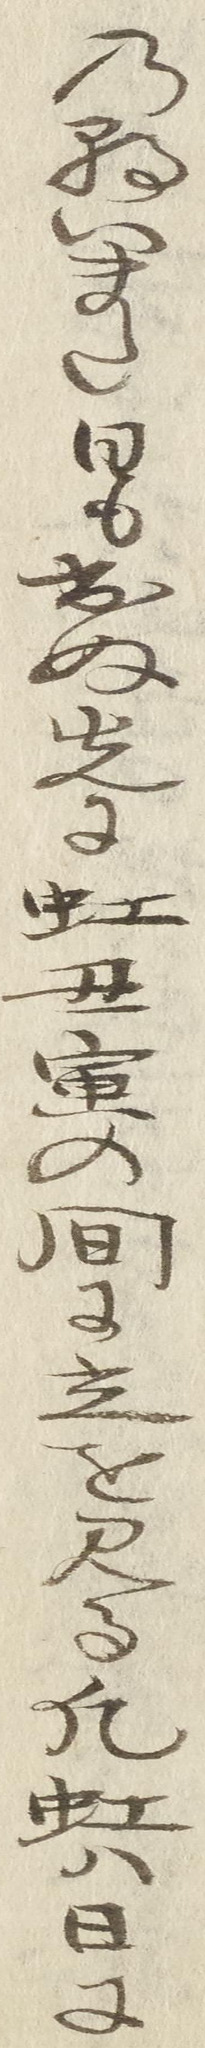の朝いまた日も出ぬ先に虹丑寅の間に立を見る凡虹は日に
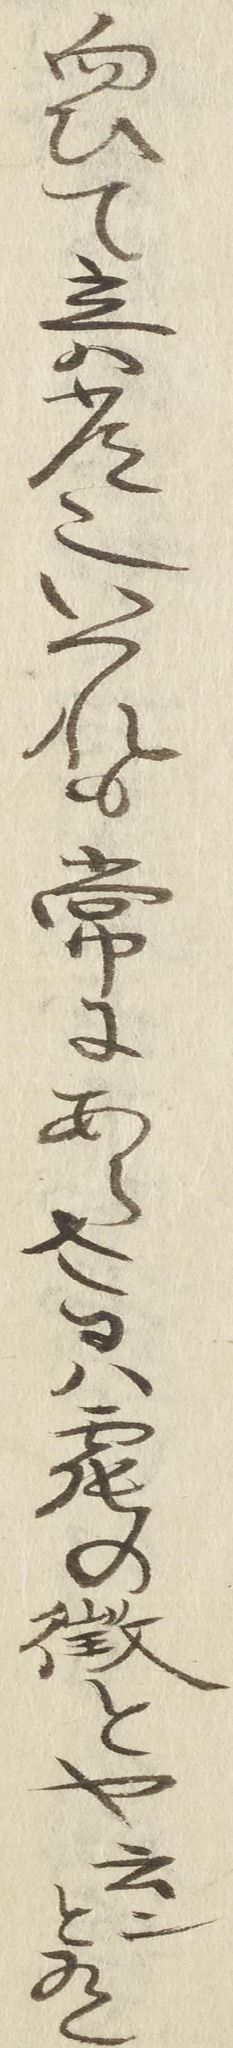向ひて立つは常也いつれも常にあらさるは震の徴とや云んと有
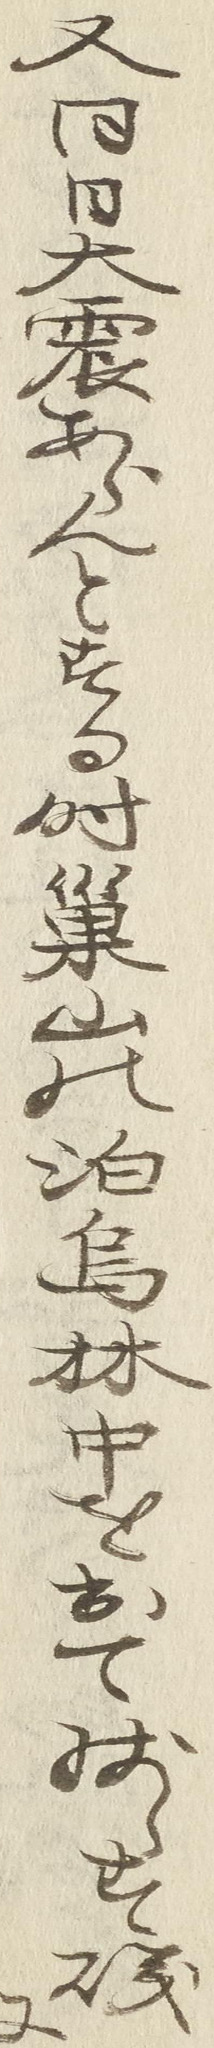又同日大震あらんとする時巣山の泊鳥林中を出て残らす磯に
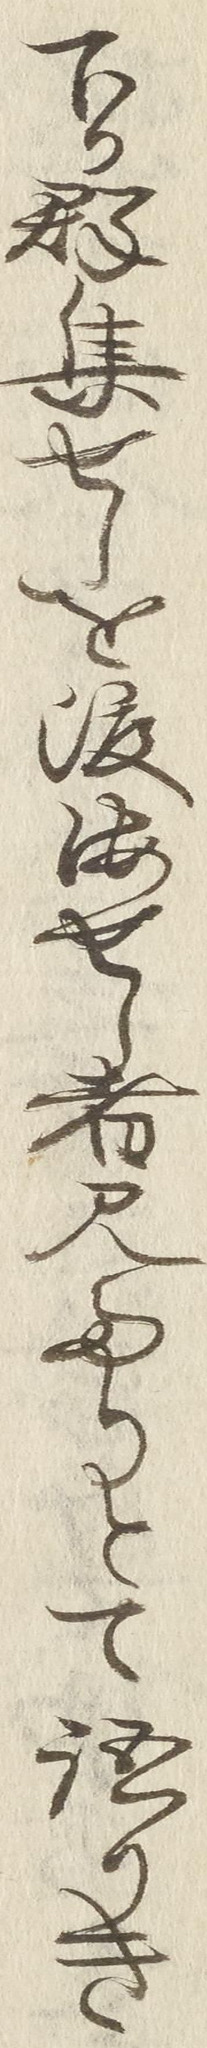下り群集せしを渡海せし者見たりとて語りき
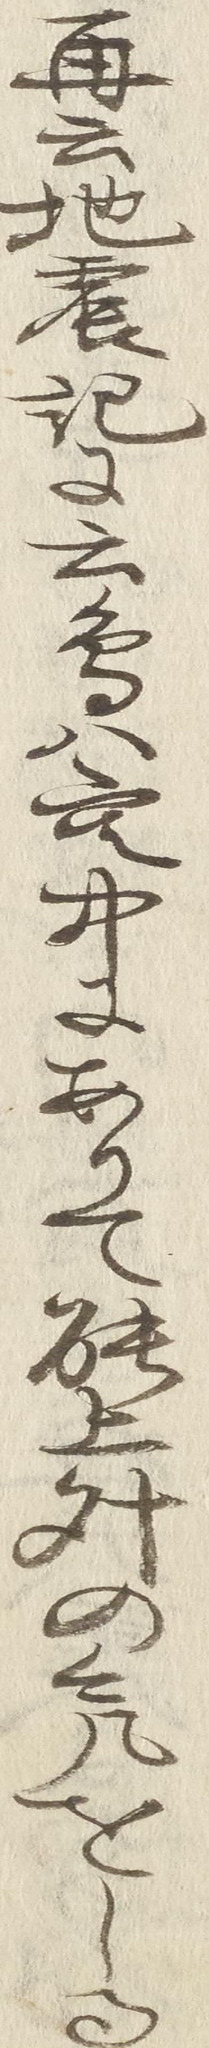再云地震記に云鳥は空中にありて能上外の気をしる
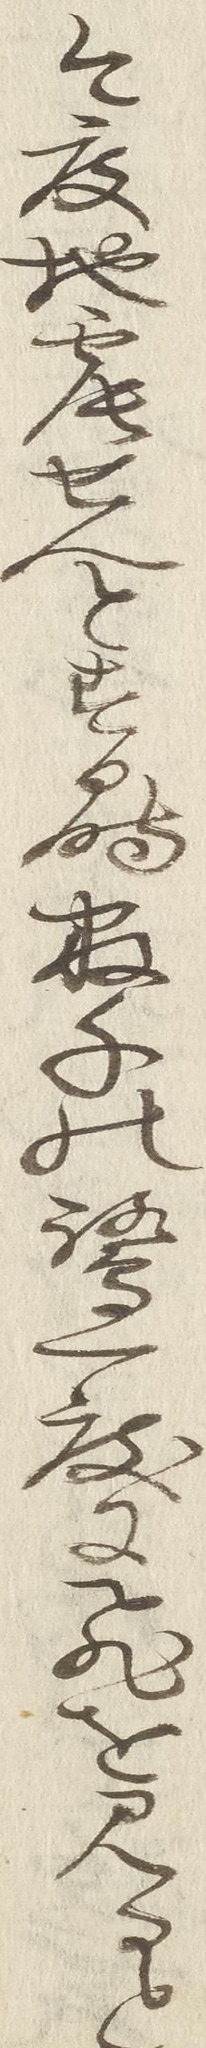今度地震せんとする時数千の鷺一度に飛を見ると
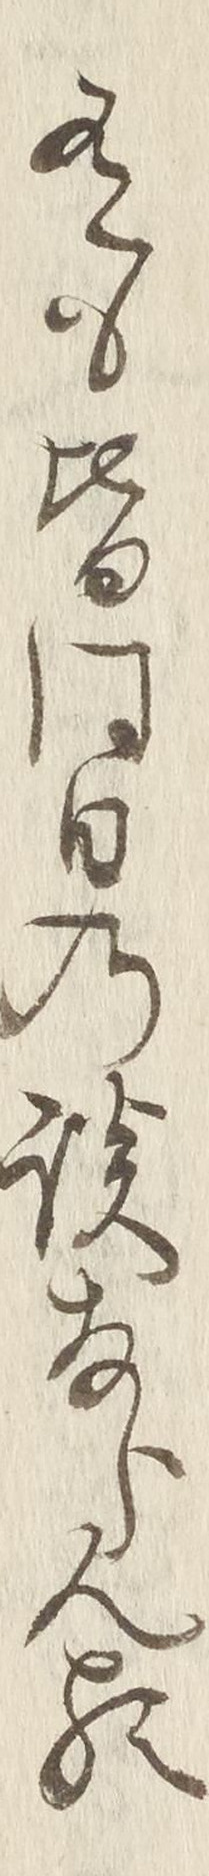有も皆同日の談ならん歟
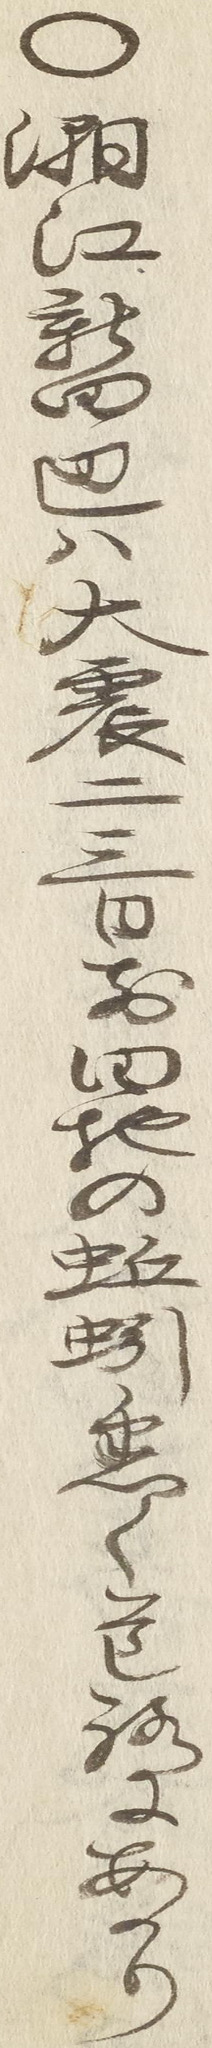〇潮江新田辺は大震ニ三日前田地の蚯蚓悉く道路にあかり
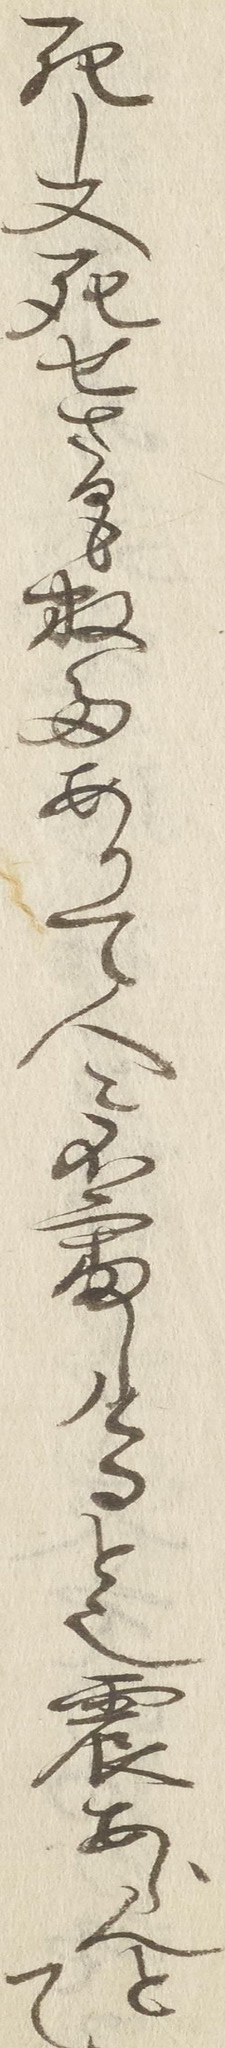死し又死せさるも数多ありて人々不審しけること也震あらんとて
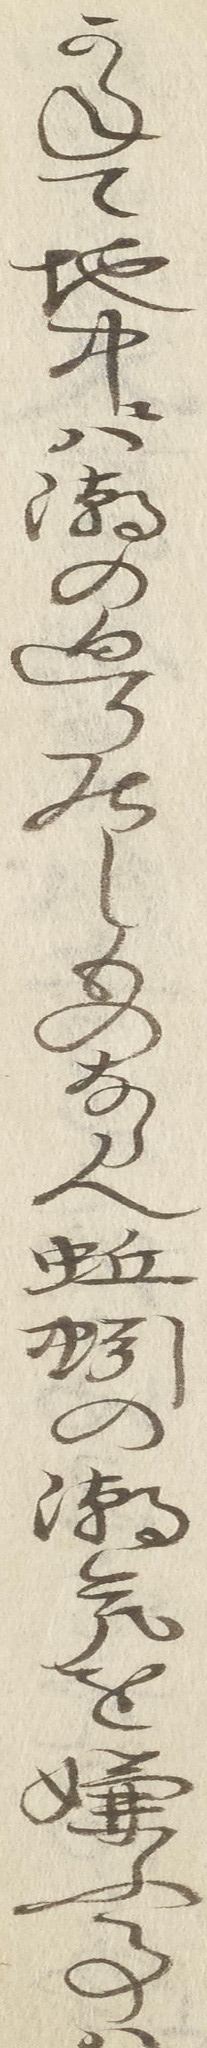かねて地中には潮の迫り居しものならん蚯蚓の潮気を嫌ふ事は
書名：地震記　上
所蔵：東京大学地震研究所図書室 Earthquake Research Institute Library, The University of Tokyo, JAPAN
